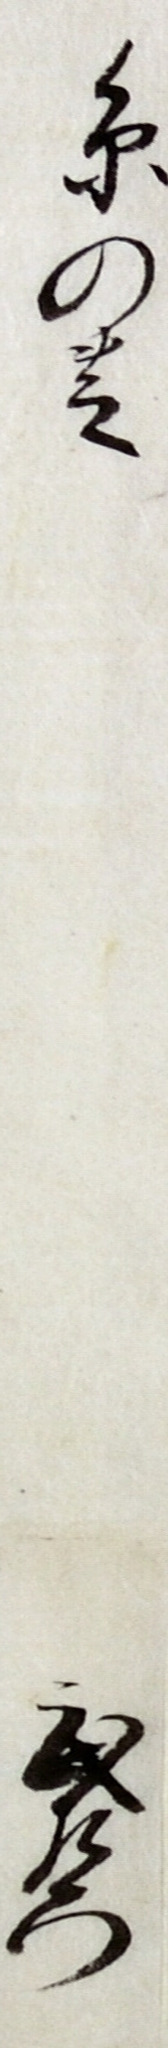原の芝武左衛門
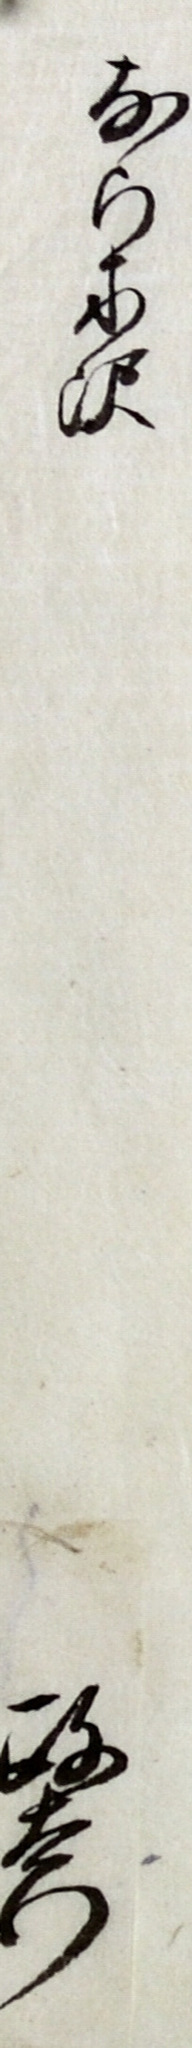なら木沢政右衛門

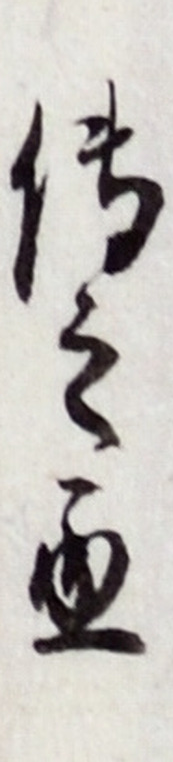伝之丞
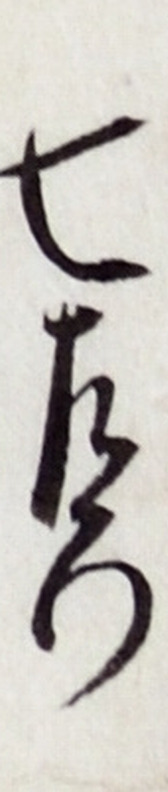又左衛門
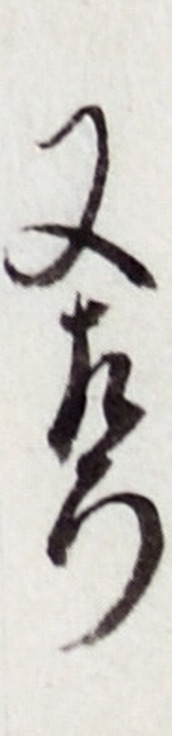又左衛門
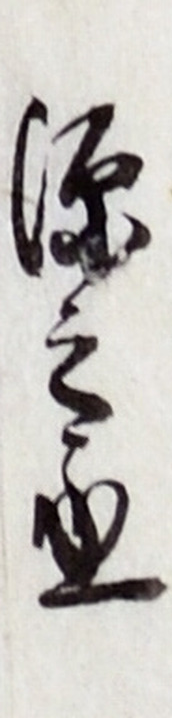伝之丞
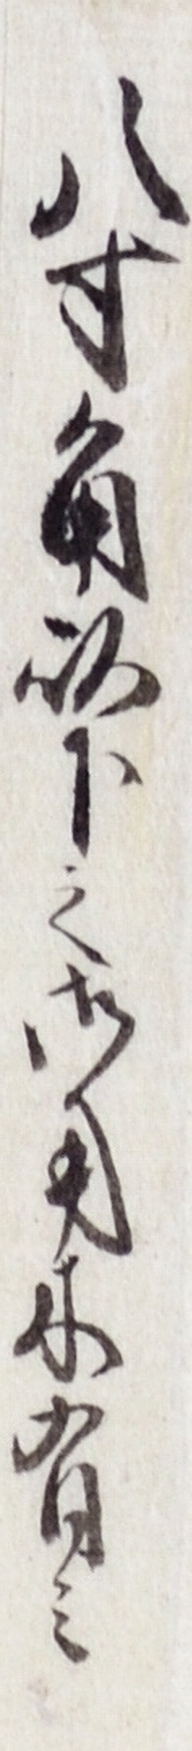八寸角以下之御用木有之
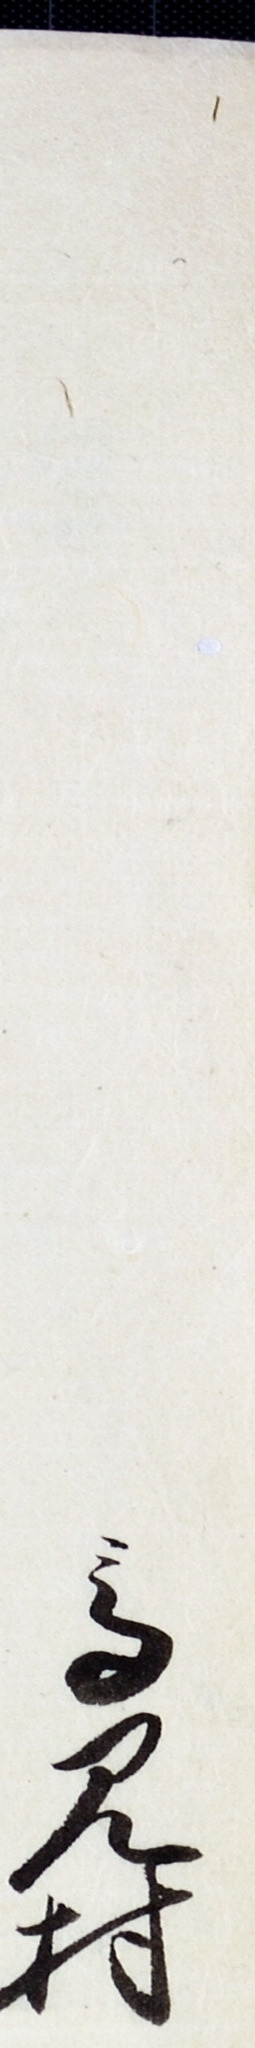高見村
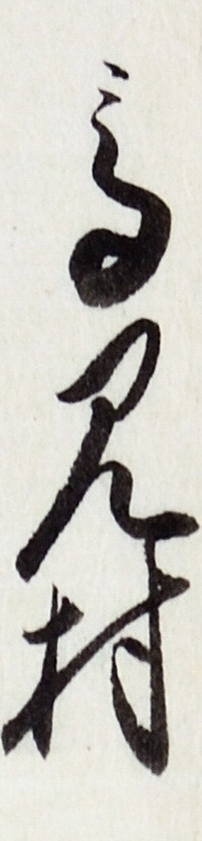高見村
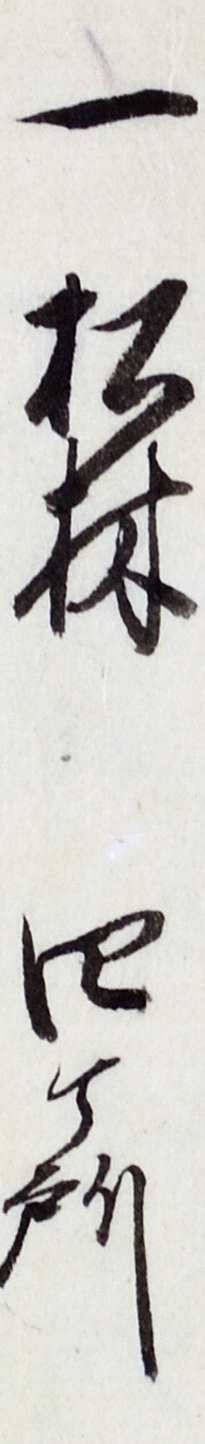一松林四ケ所
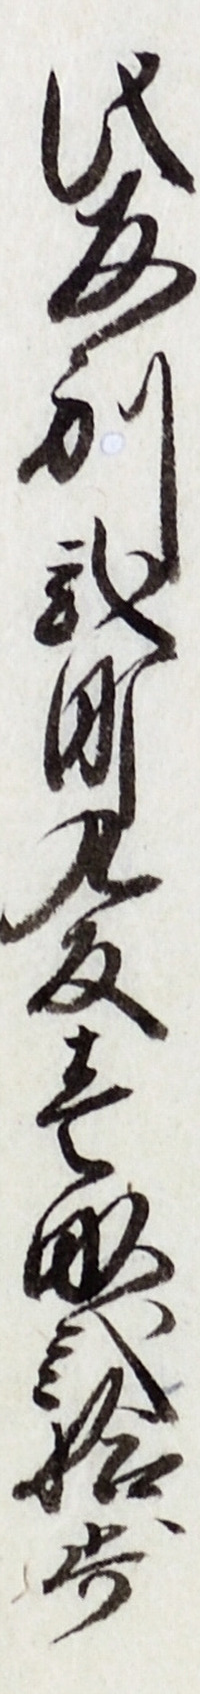此反別弐町九反壱畝弐拾歩
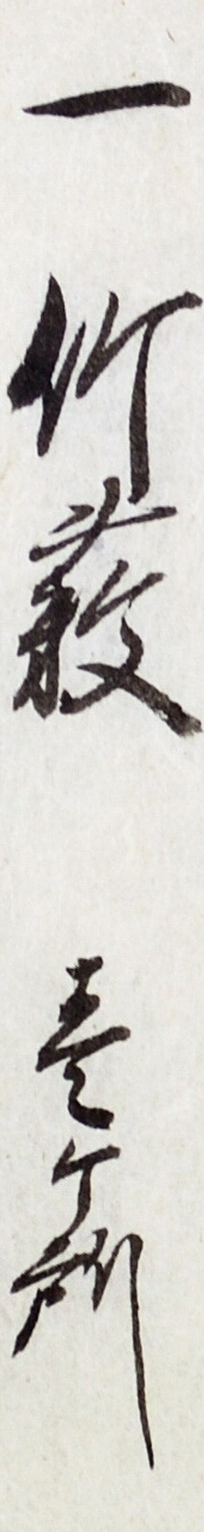一竹藪壱ケ所
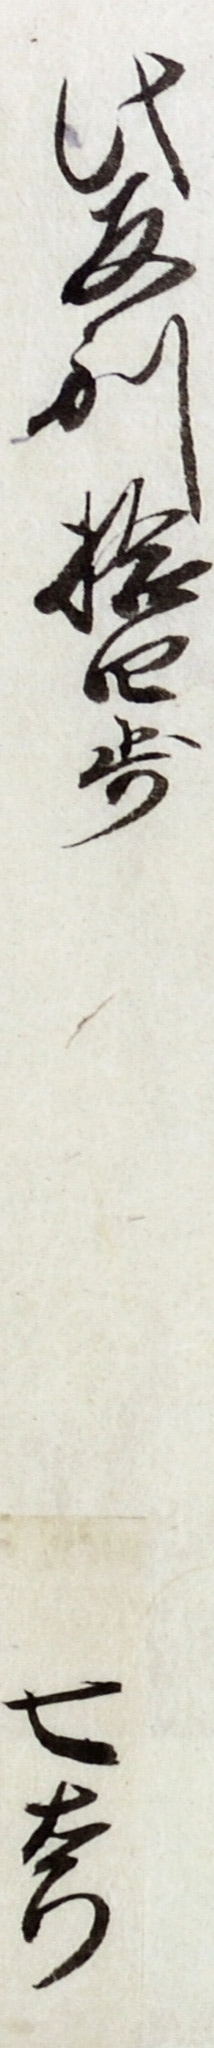此反別拾四歩七右衛門
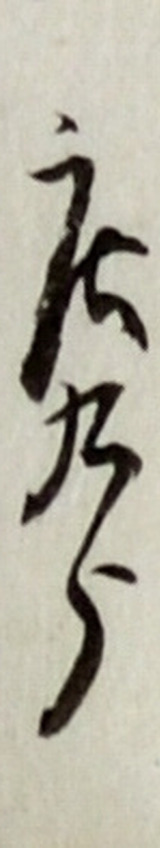庄九郎

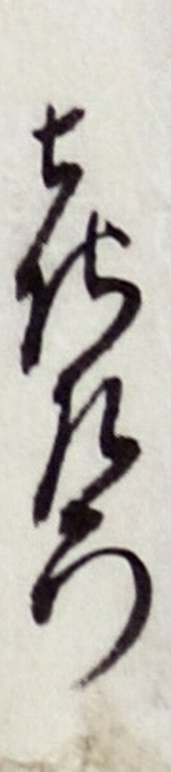喜左衛門
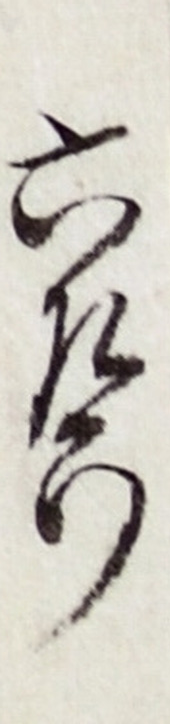喜左衛門
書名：御領分中御林御藪附帳
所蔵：伊那市立高遠町図書館・合同会社AMANE
